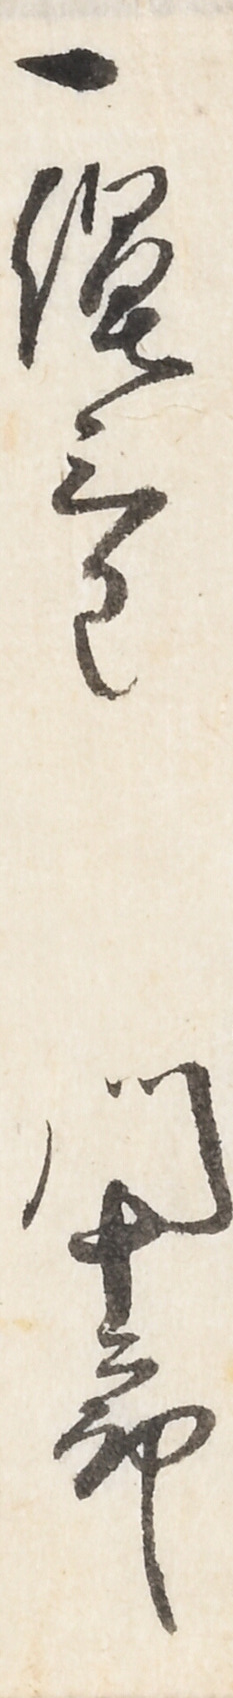一縄三わ門十郎
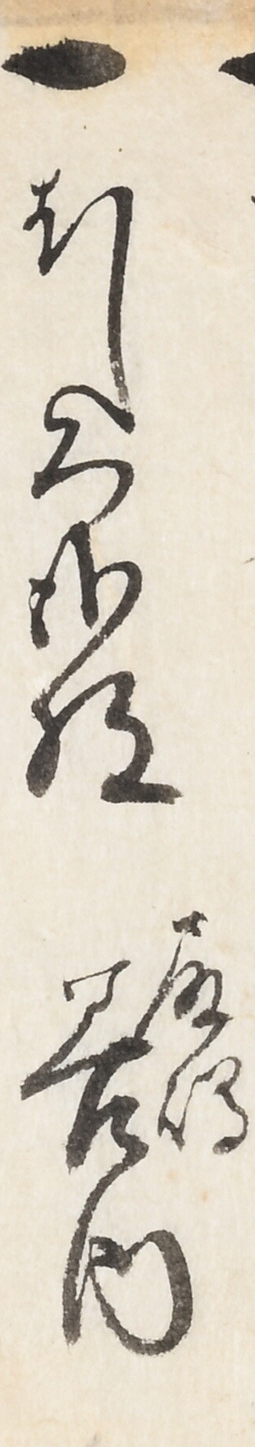一むしろ弐枚善内
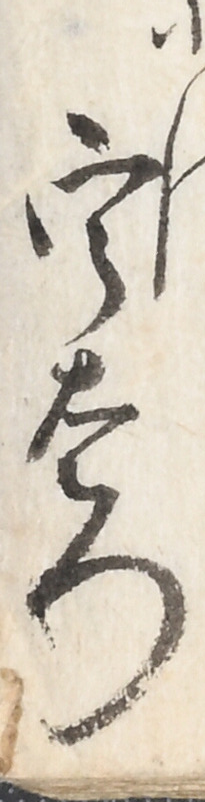太右衛門

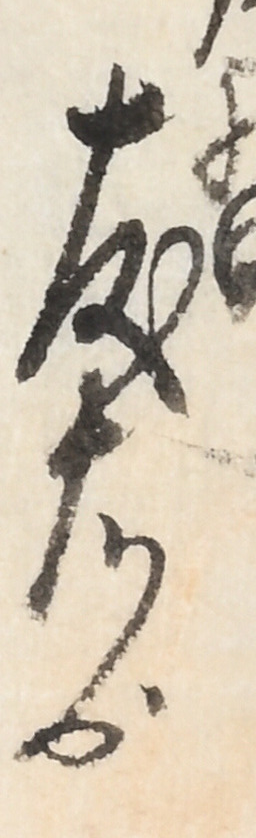友右衛門
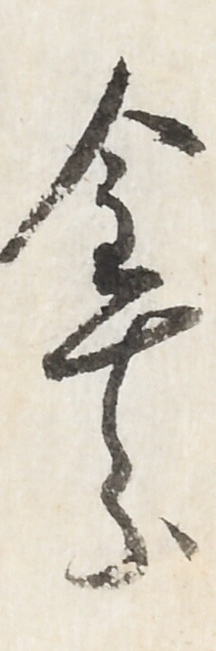金十郎
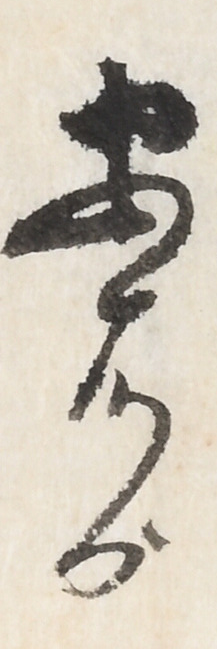安右衛門
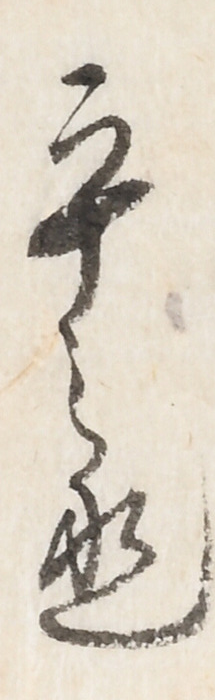平之丞
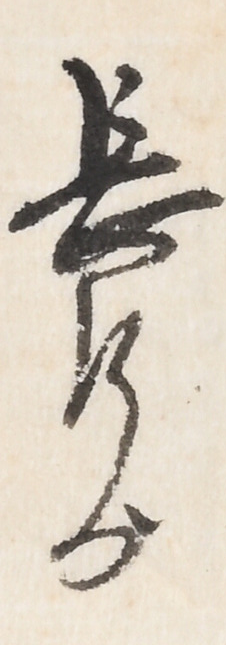長左衛門
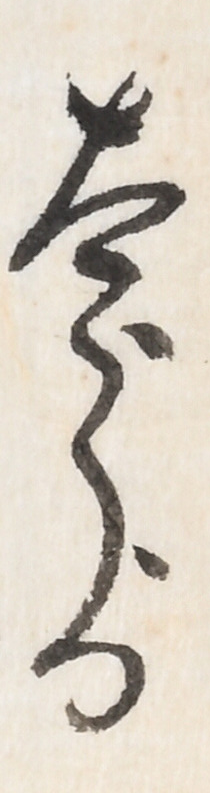太郎右衛門
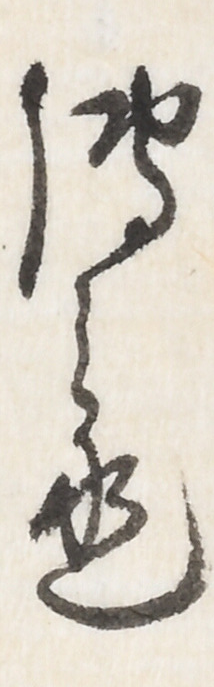伝之丞
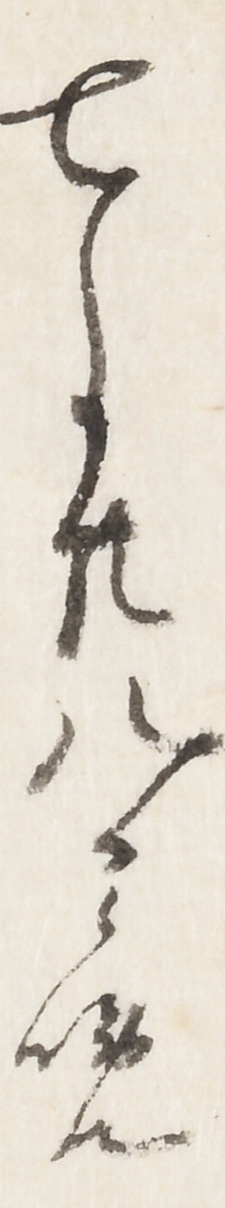七月廿八日之晩
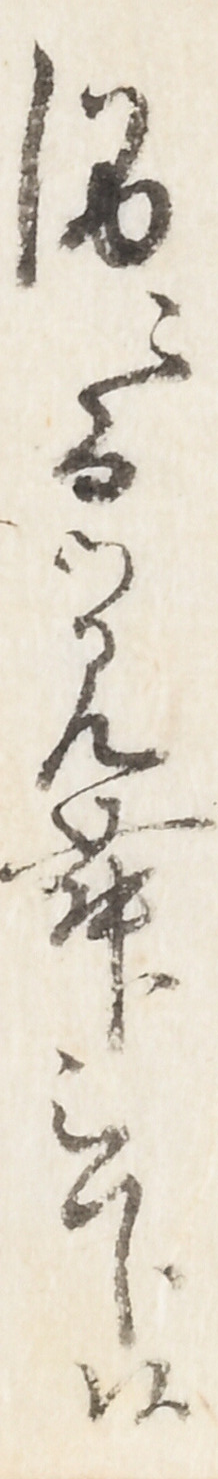酒ニ而御見舞被下候
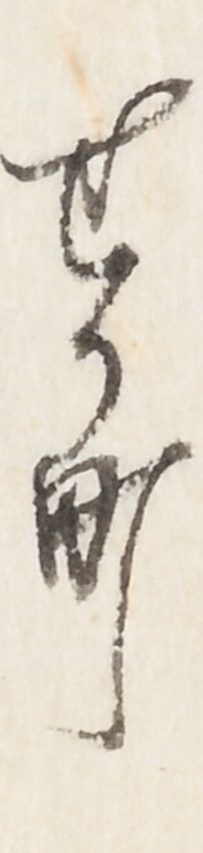せり町
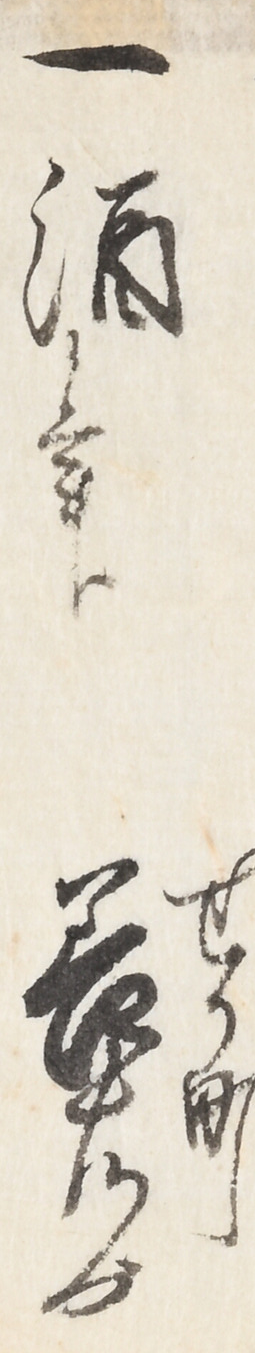一酒壱斗善左衛門
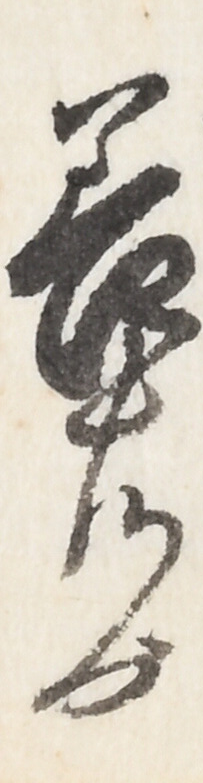友右衛門

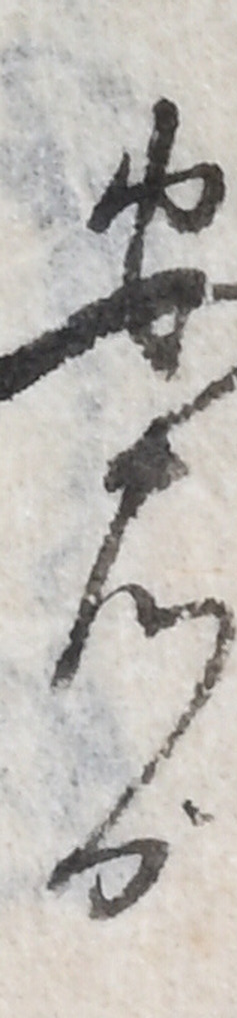作右衛門
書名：合力覚帳
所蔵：伊那市立高遠町図書館・合同会社AMANE
